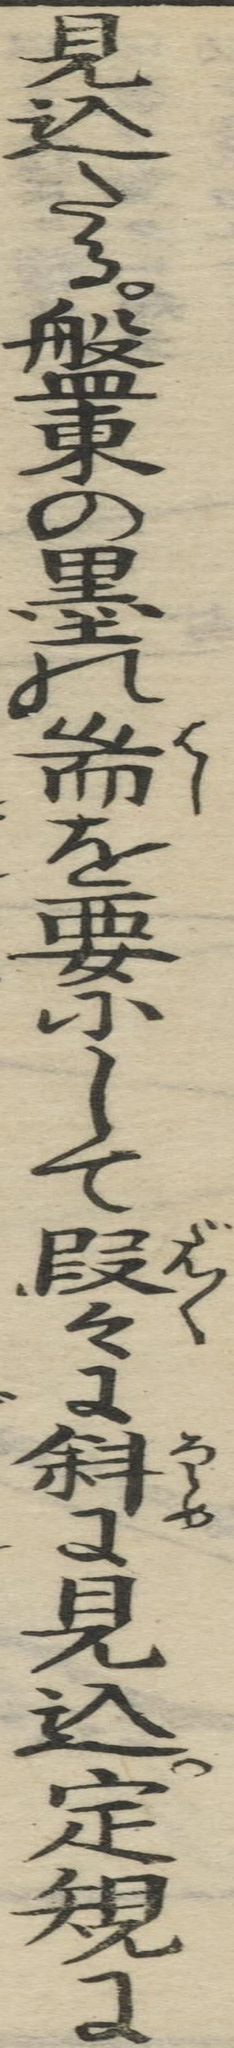見込たる。盤東の墨の端を要にして段々に斜に見込。定規に
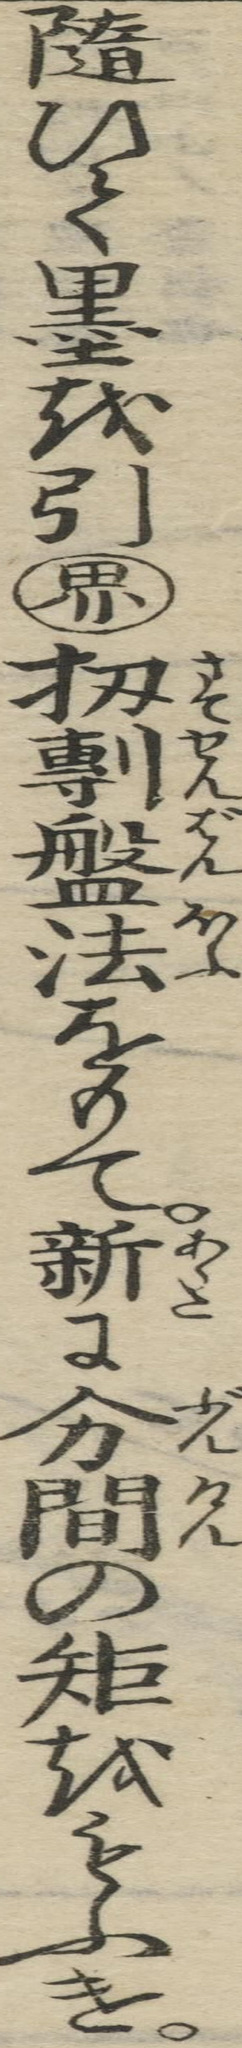随ひて墨を引界扨剸盤法をもて。新に分間の矩をもふけ。
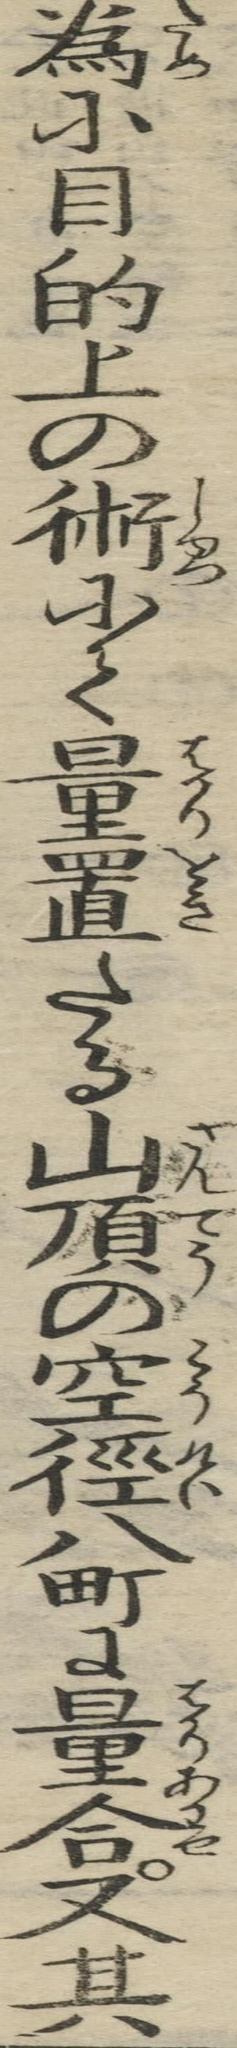為に目的上の術にて量置たる山頂の空径八町に量合。又其
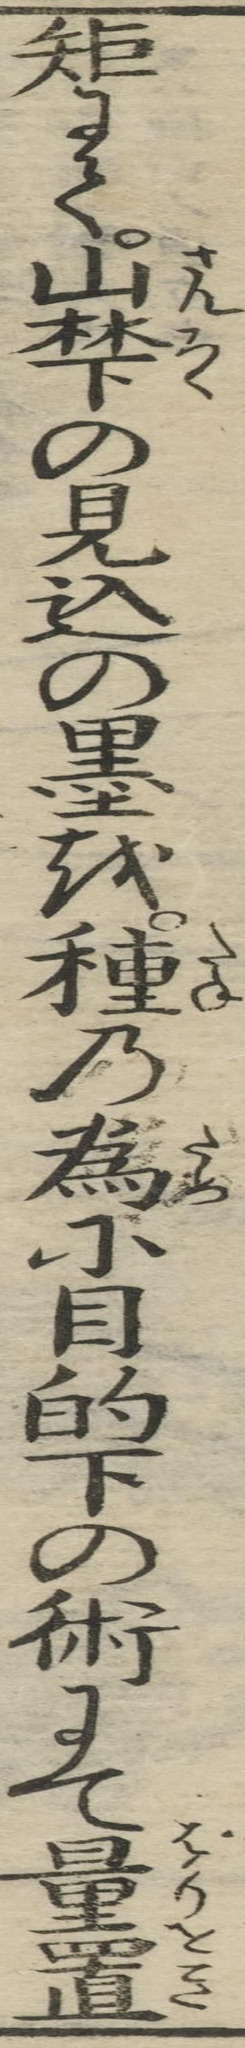矩にて。山麓の見込の墨を。種の為に目的下の術にて量置
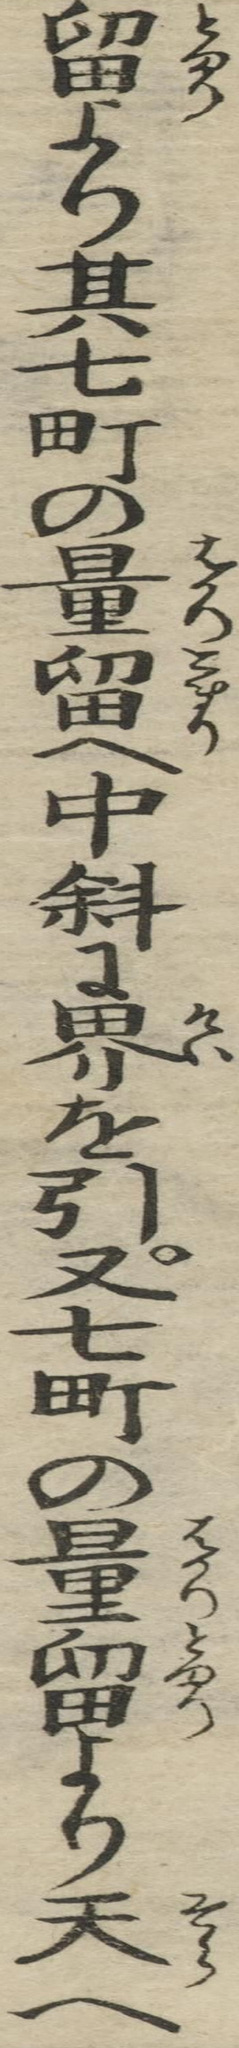留より其七町の量留へ中斜に界を引。又七町の量留より天へ
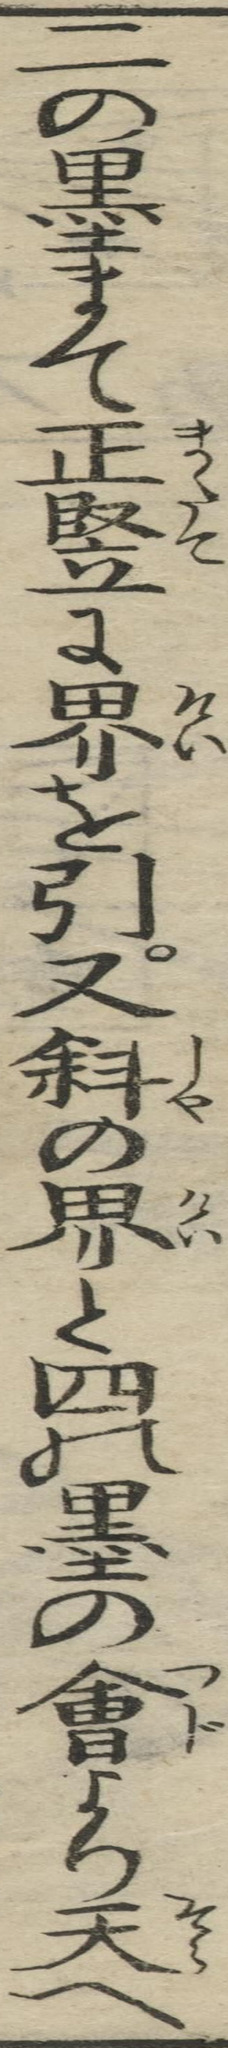二の墨まて正竪に界を引。又斜の界と四の墨の会より天へ
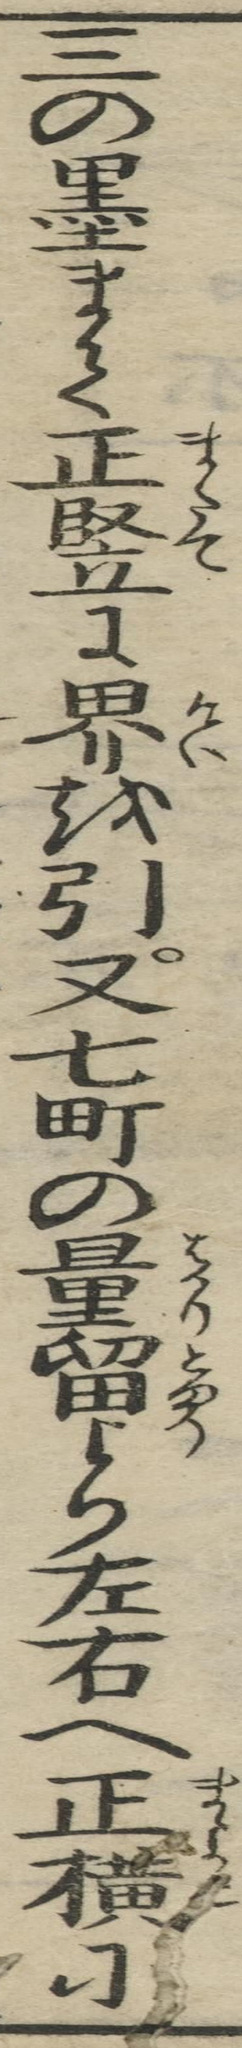三の墨まて正竪に界を引。又七町の量留より左右へ正横に
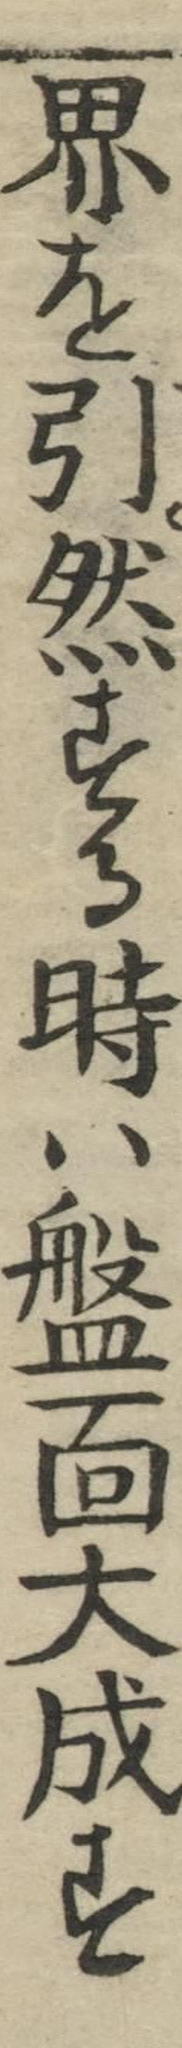界を引。然する時は盤面大成す

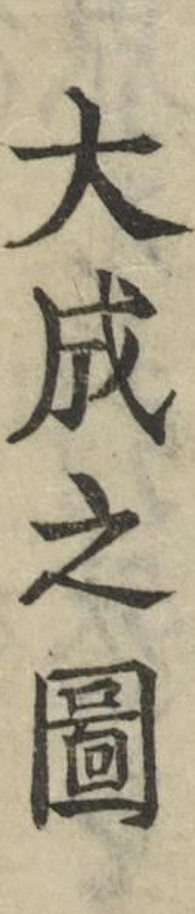大成之図
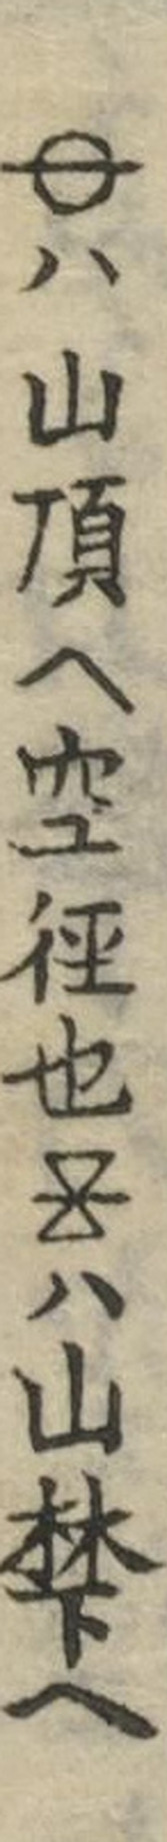◯ハ山頂ヘ空径也▽△ハ山麓ヘ
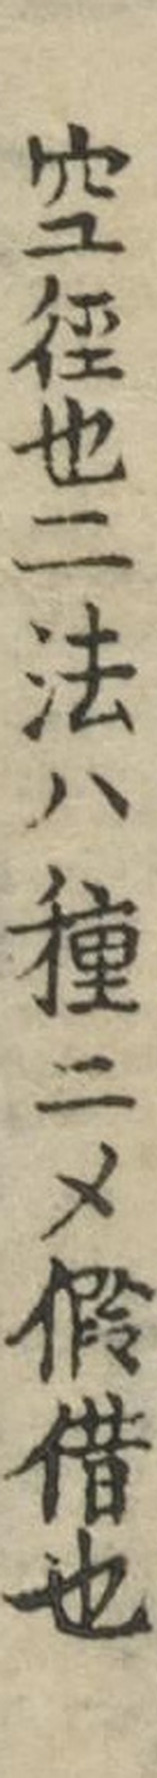空径也二法ハ種ニ〆仮借也
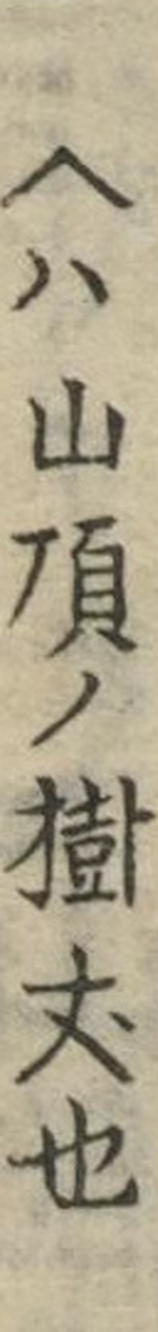𠆢ハ山頂ノ樹丈也
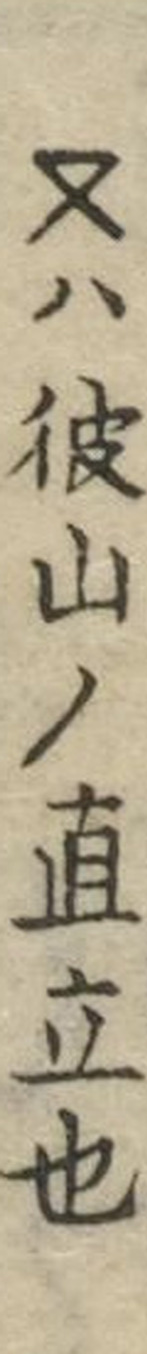又ハ彼山ノ直立也
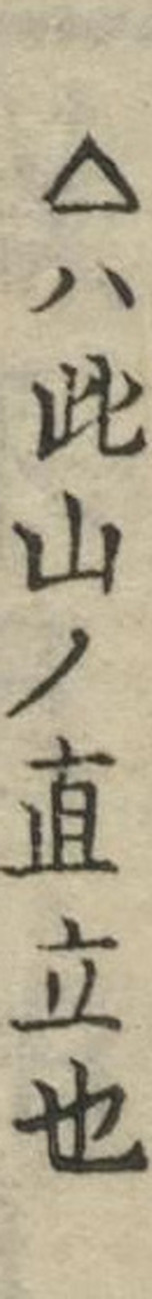△ハ此山ノ直立也
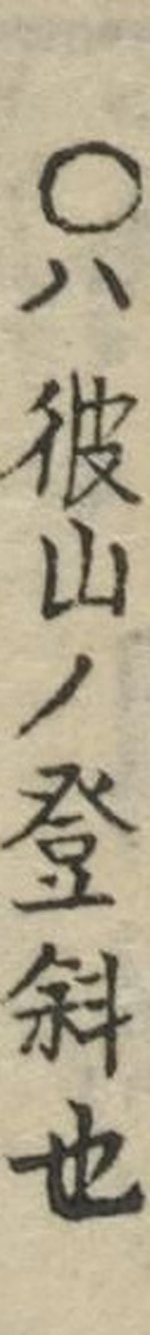◯ハ彼山ノ登斜也
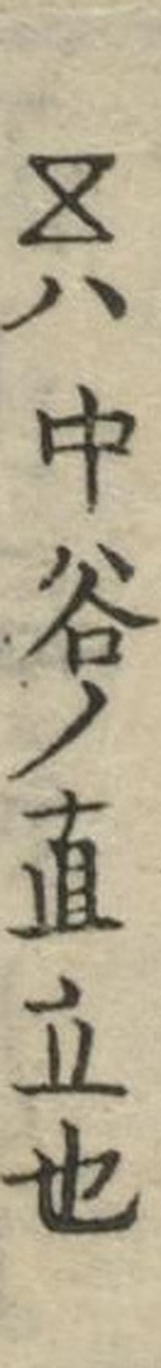▽△ハ中谷ノ直立也
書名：量地指南　巻之三（内題）
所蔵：東京大学地震研究所図書室 Earthquake Research Institute Library, The University of Tokyo, JAPAN
